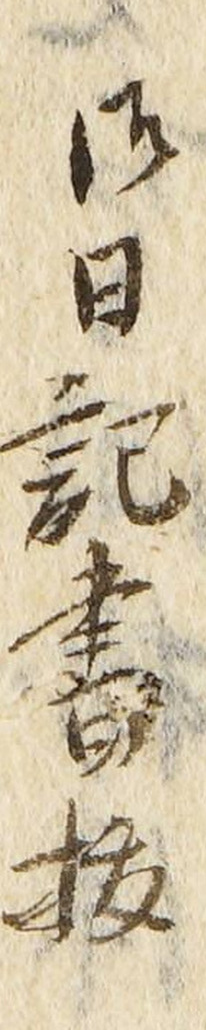御日記書抜
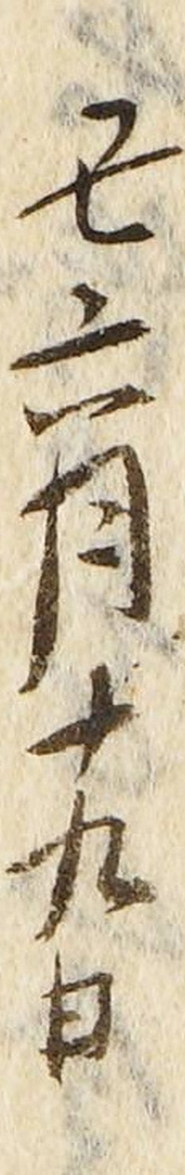丑六月十九日
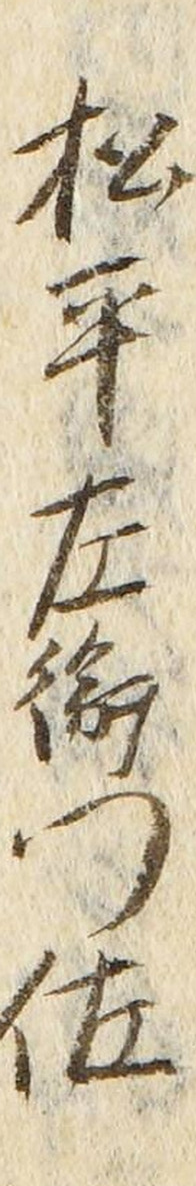松平左衛門佐
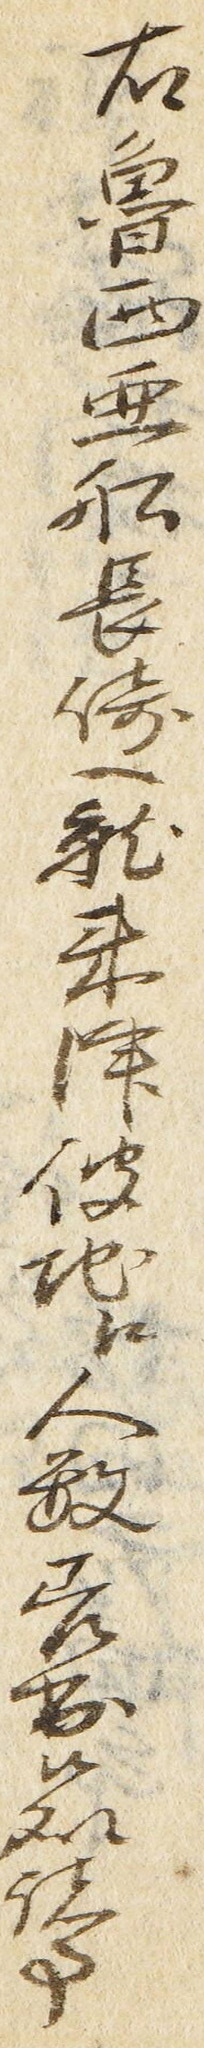右魯西亜船長崎へ就来津彼地え人数差出候処諸事
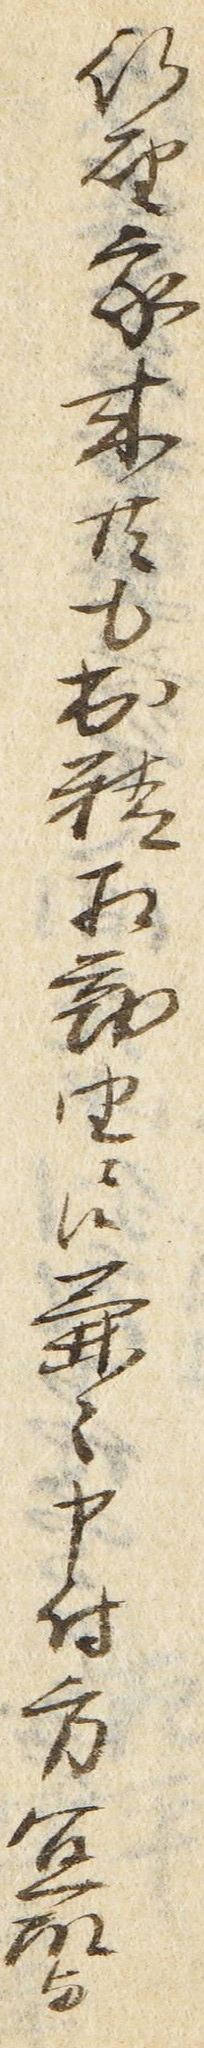行届家来共も出精相勤由に候兼々申付方宜故と
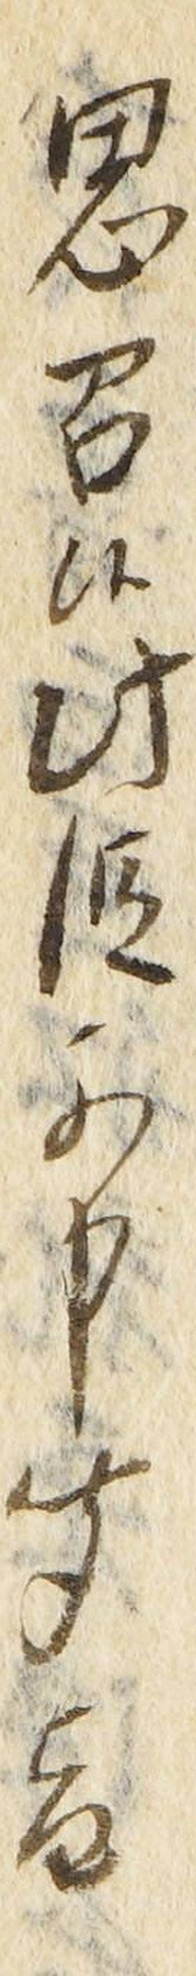思召候此段可申聞旨
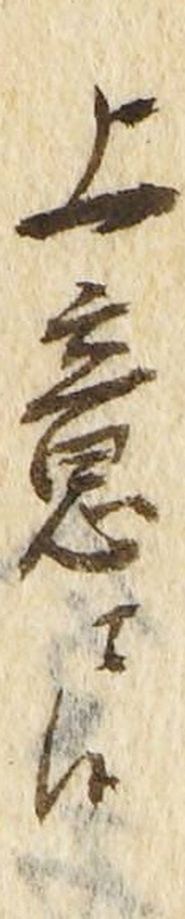上意に候
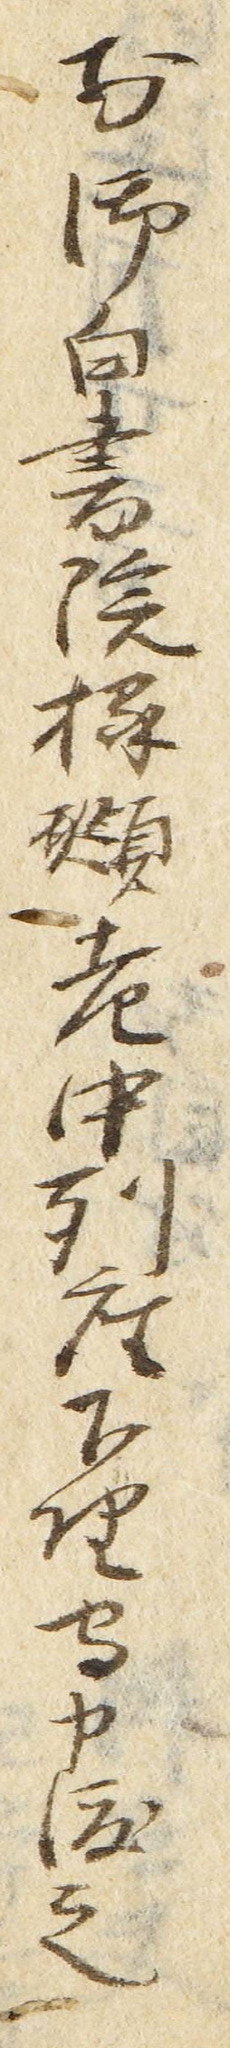於御白書院椽頬老中列座下野守申渡之

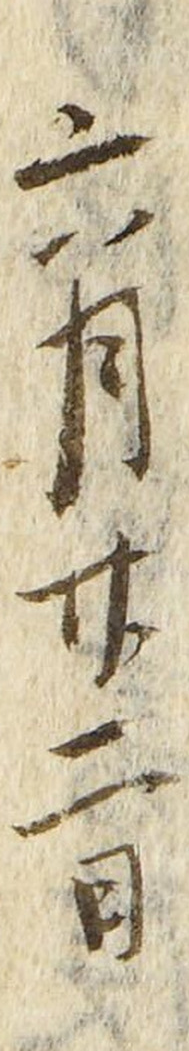六月廿二日
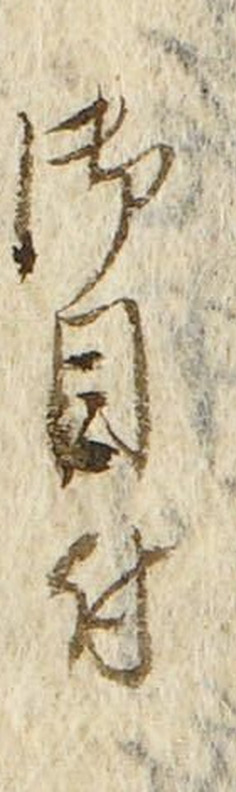御目付
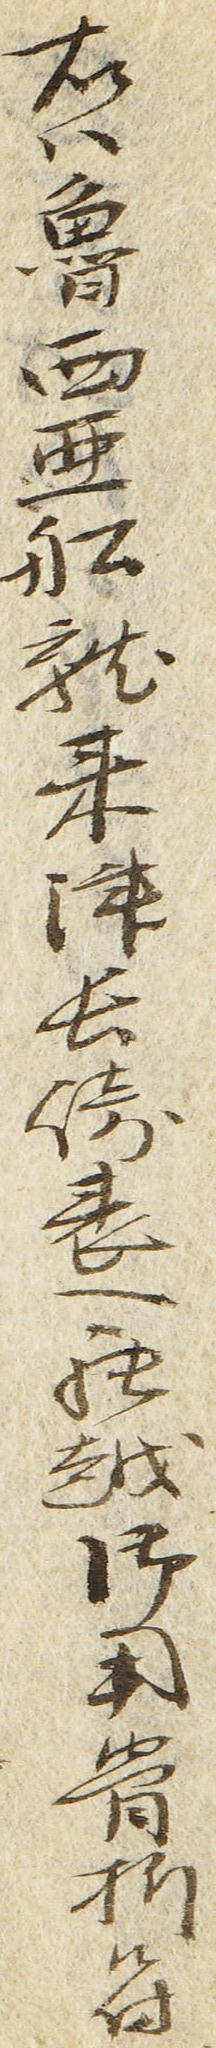右は魯西亜船就来津長崎表へ罷越御用骨折候付
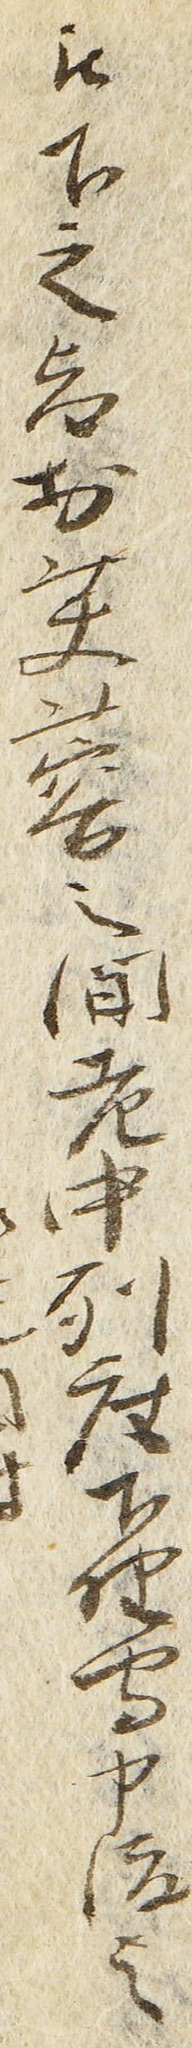被下之旨於芙蓉之間老中列座下野守申渡之
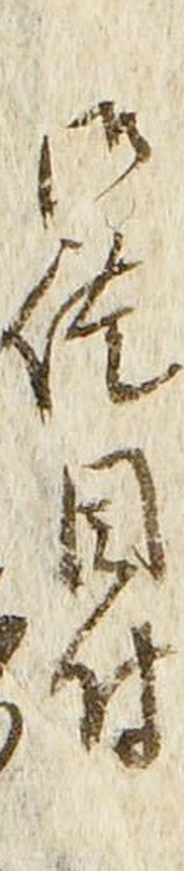御徒目付
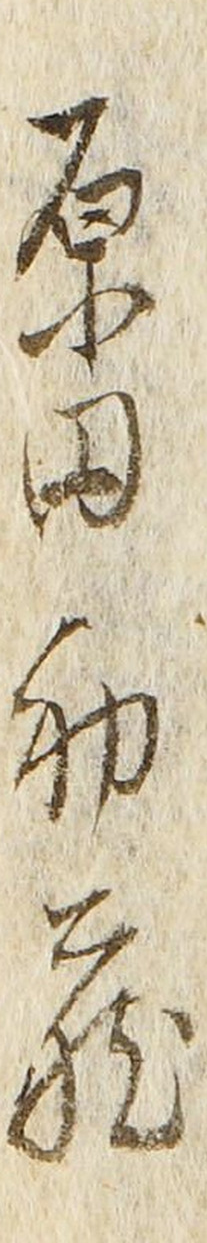原田初蔵
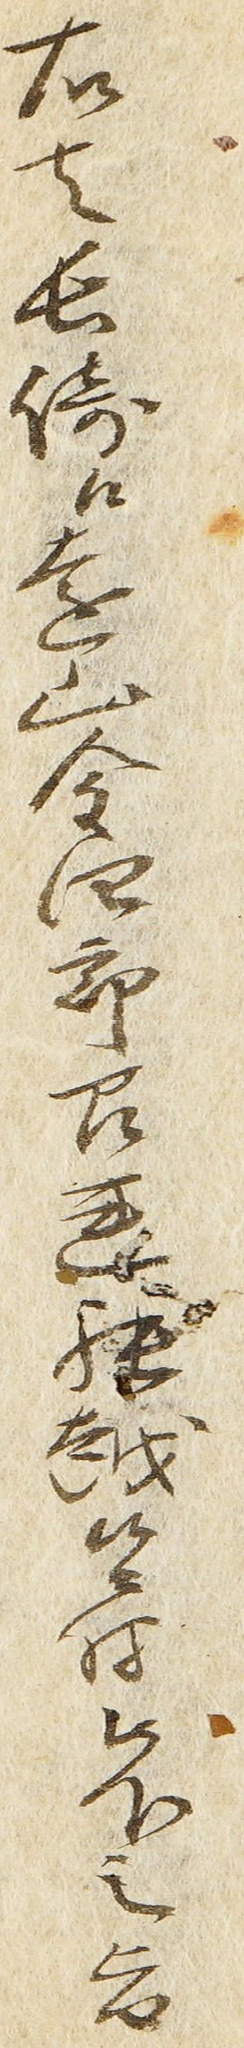右は長崎え遠山金四郎召連罷越候に付被下之旨
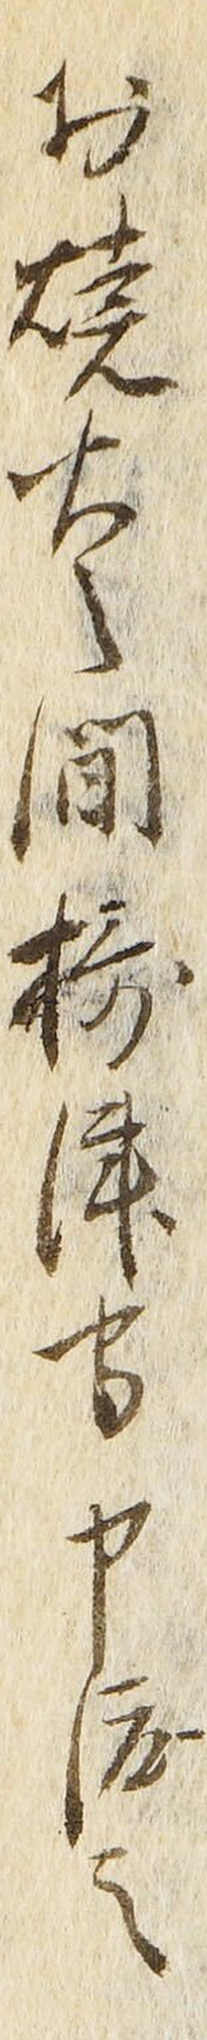於焼火之間摂津守申渡之
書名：漂民後記
